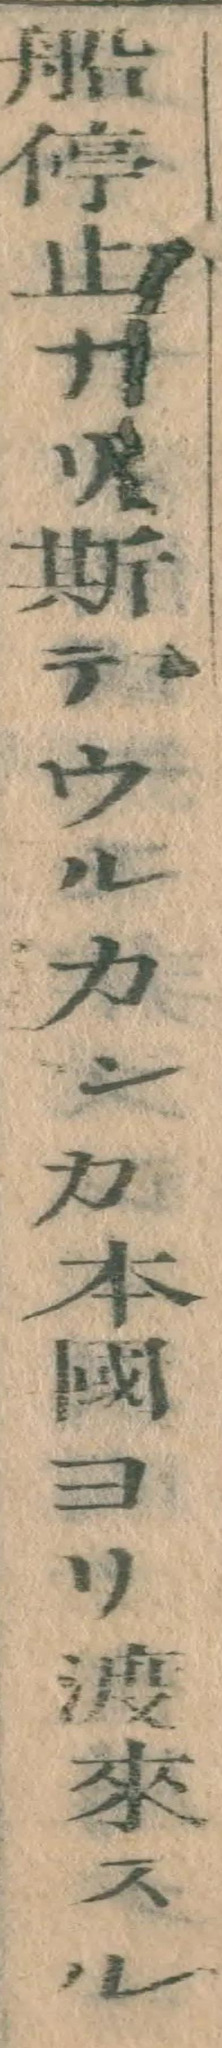船停止ナリ斯テウルカンカ本国ヨリ渡来スル
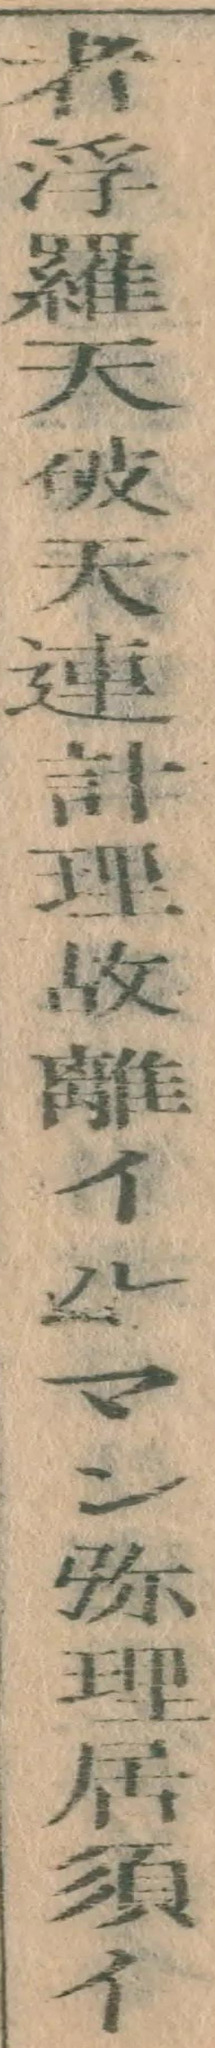者浮羅天破天連計理故離イルマン弥理居須イ
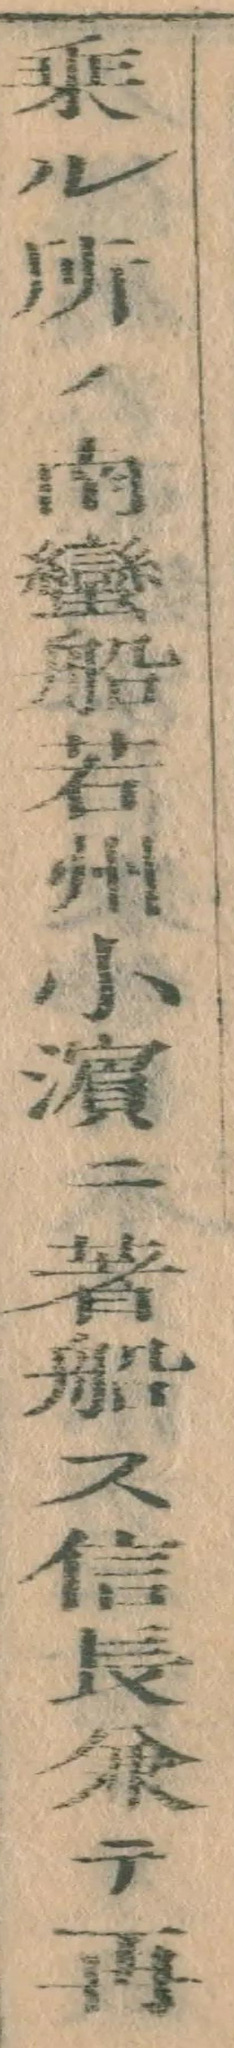乗ル所ノ南蛮船若州小浜ニ著船ス信長兼テ再
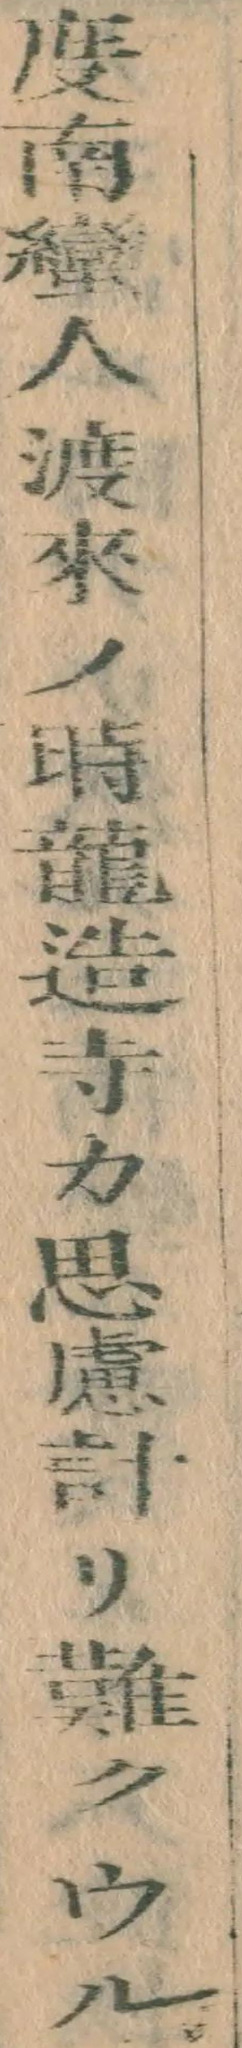度南蛮人渡来ノ時竜造寺カ思慮計リ難クウル
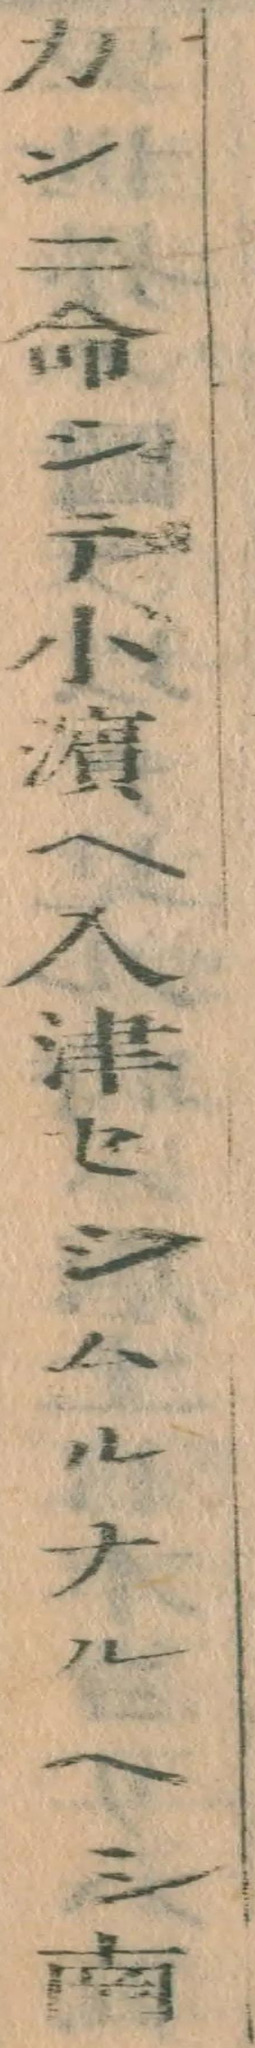カンニ命シテ小浜ヘ入津セシムルナルヘシ南
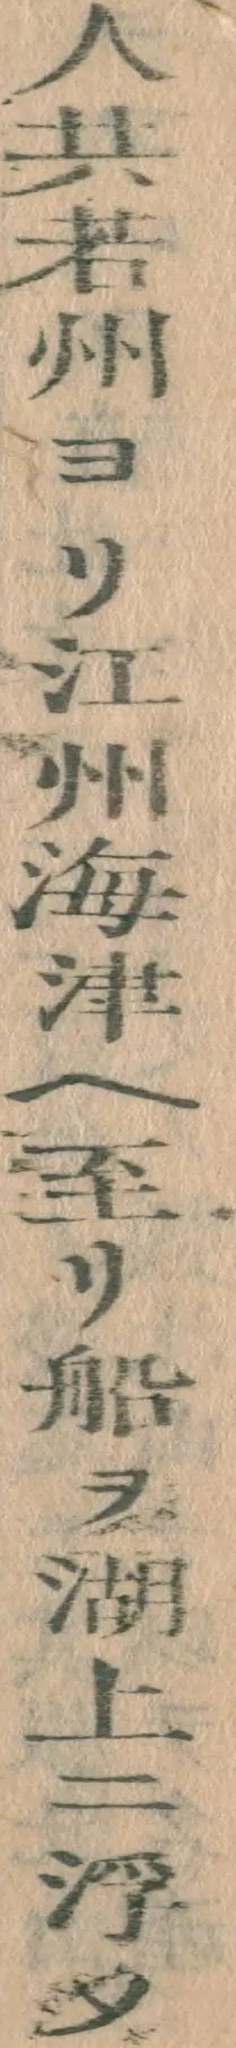人共若州ヨリ江州海津ヘ至リ船ヲ湖上ニ浮メ
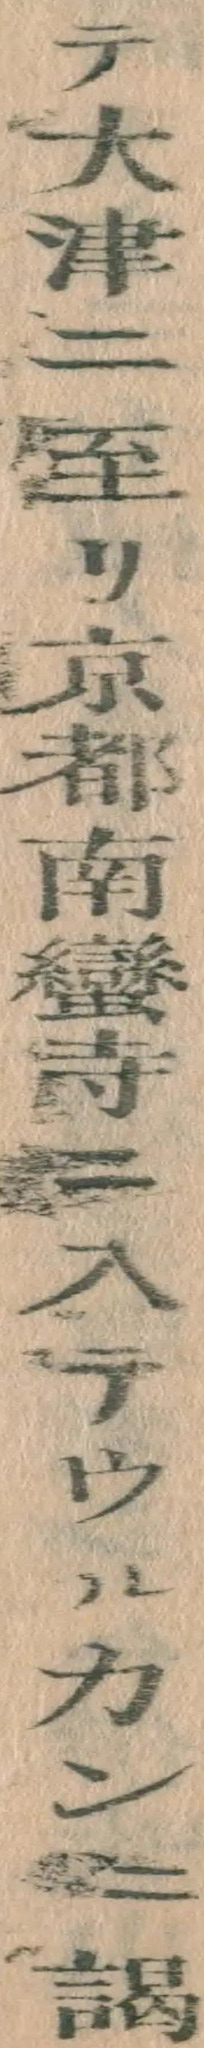テ大津ニ至リ京都南蛮寺ニ入テウルカンニ謁
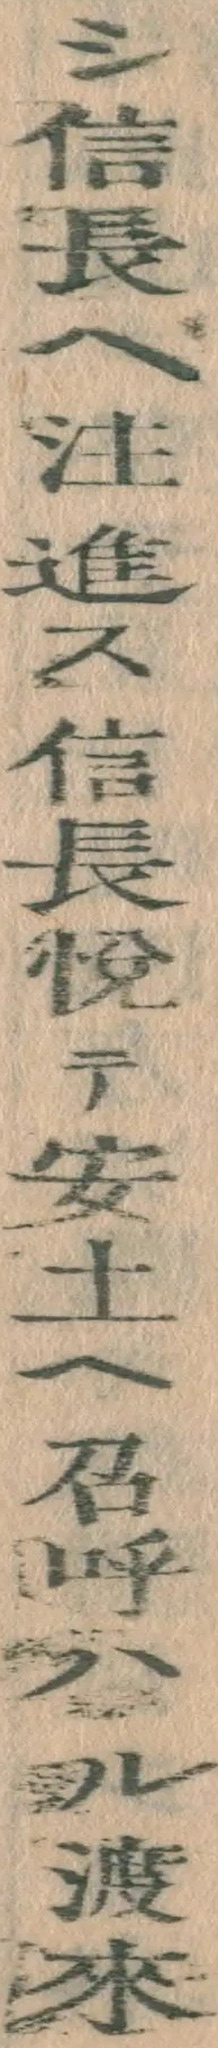シ信長ヘ注進ス信長悦テ安土ヘ召呼ハル渡来
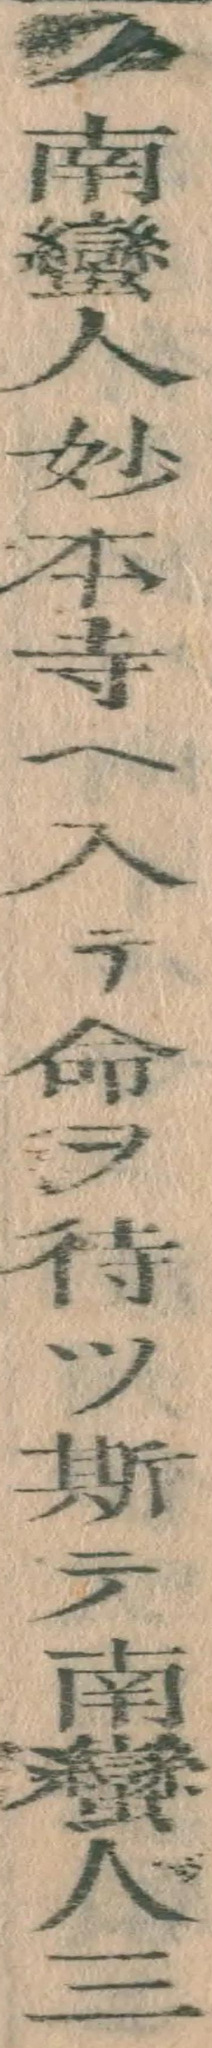ノ南蛮人妙本寺へ入テ命ヲ待ツ斯テ南蛮人三
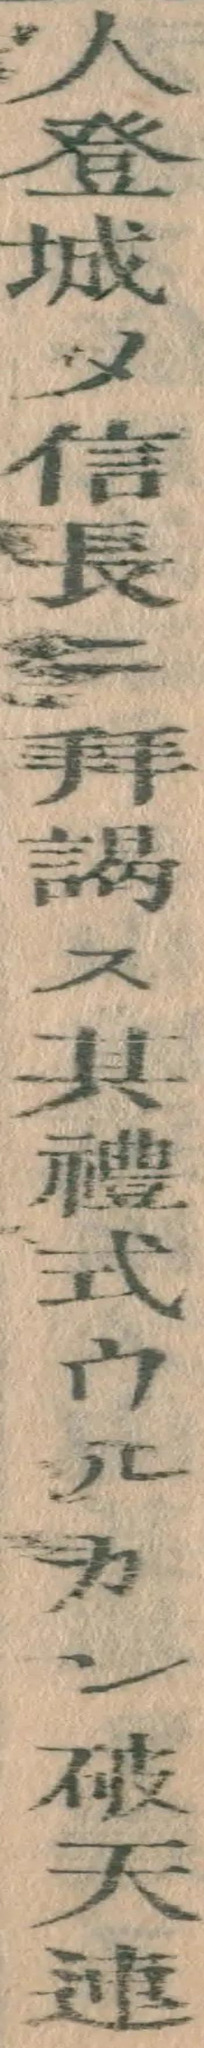人登城シテ信長ニ拝謁ス其礼式ウルカン破天連
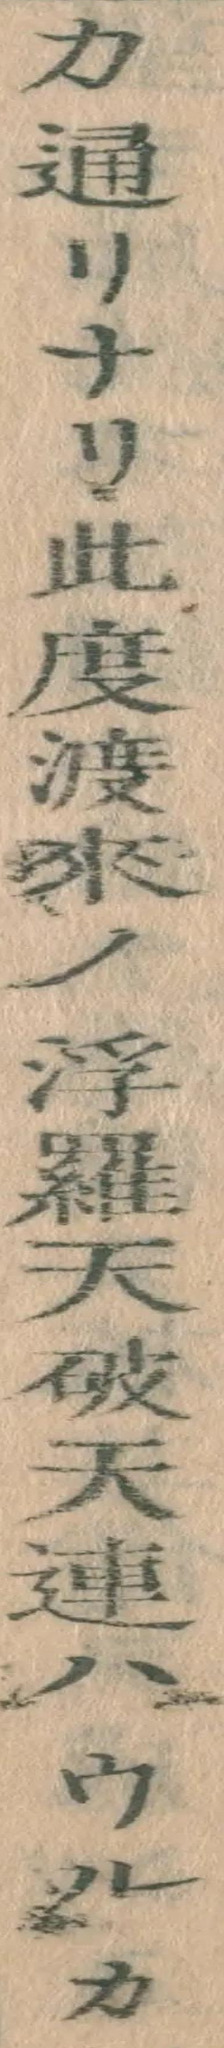カ通リナリ此度渡来ノ浮羅天破天連ハウルカ
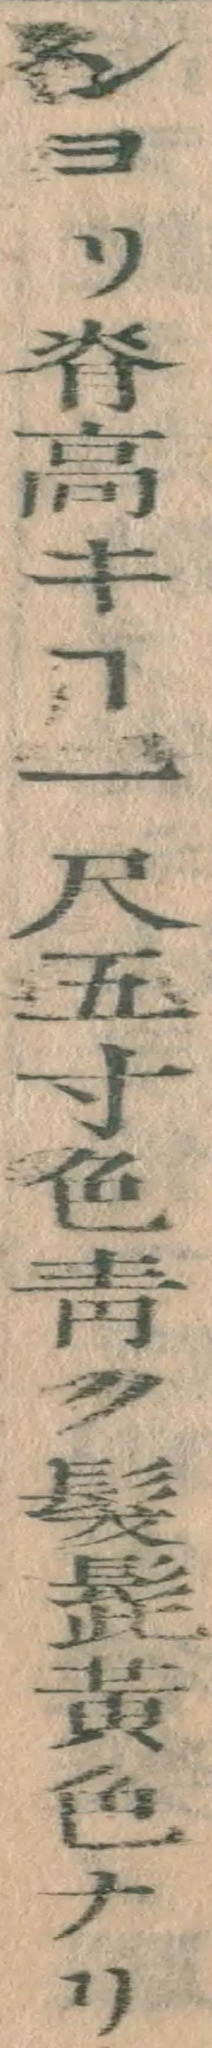ンヨリ背高キヿ一尺五寸色青ク髪髭黄色ナリ
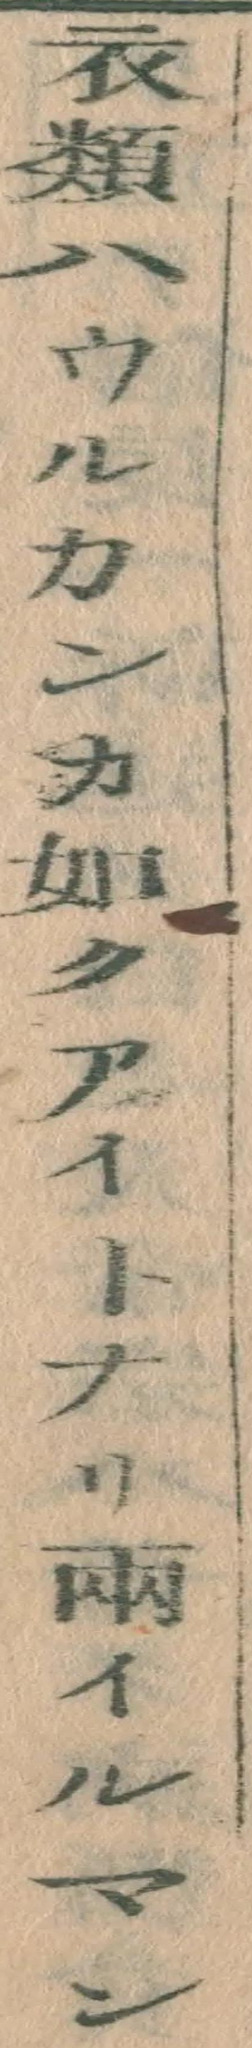衣類ハウルカンカ如クアイトナリ両イルマン

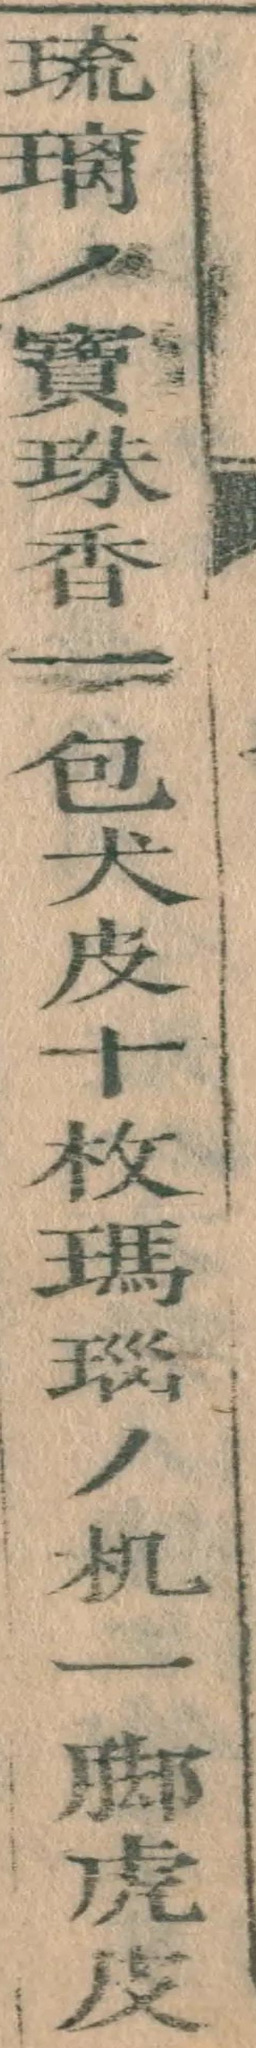琉璃ノ宝珠香一包犬皮十枚瑪瑙ノ机一脚虎皮
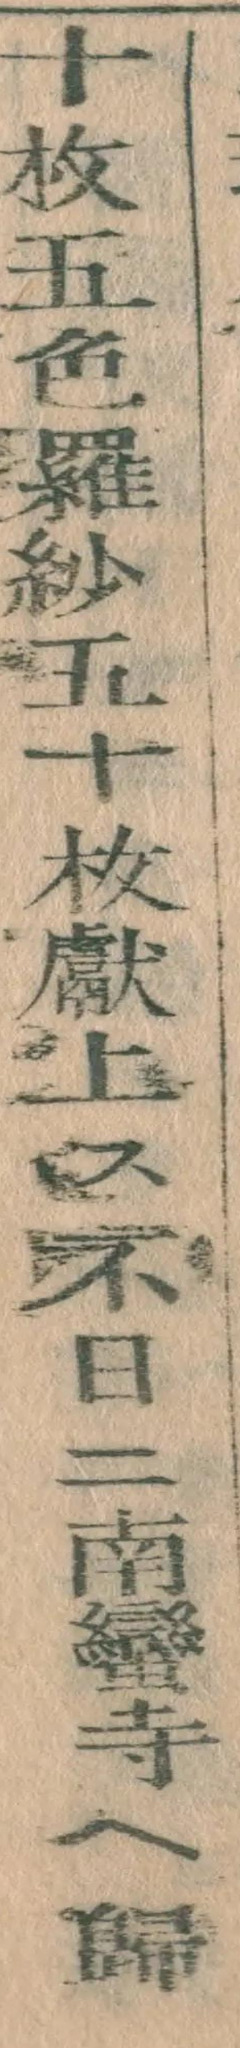十枚五色羅紗五十枚献上ス不日ニ南蛮寺へ帰
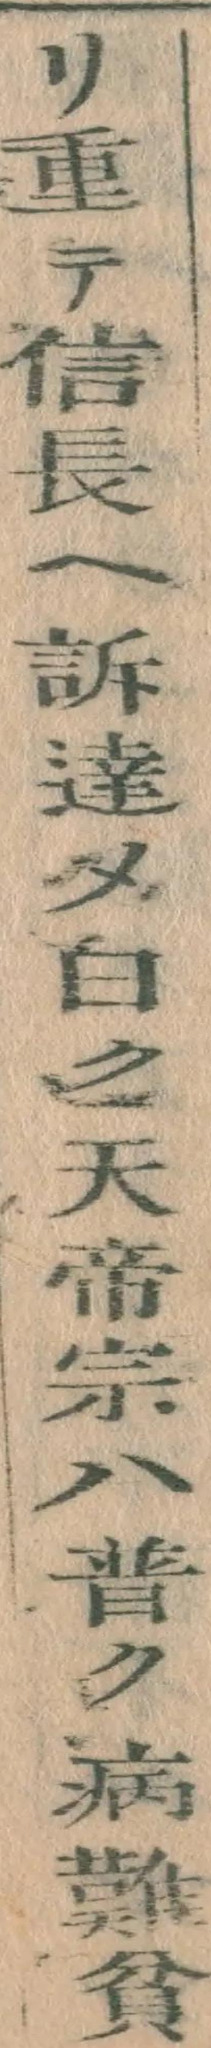リ重テ信長へ訴達シテ曰ク天帝宗ハ普ク病難貧
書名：南蛮寺興廃記
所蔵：国立国会図書館 National Diet Library, JAPAN
